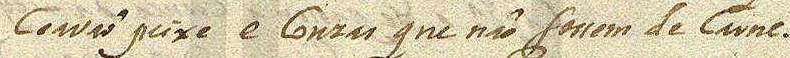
Ceavaõ peixe e Couzas que naõ fossem de Carne.
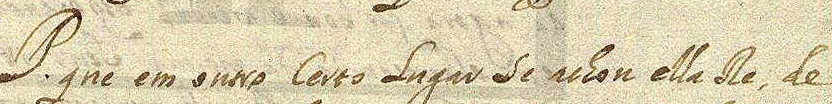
P. que em outro Certo Lugar se achou ella Re, de
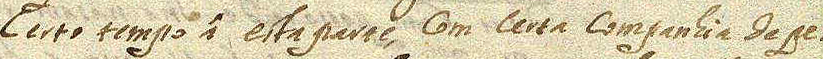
Certo tempo â esta parte, com certa companhia de pe
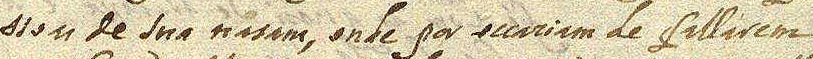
ssoas de sua nasam, onde por occaziam de fallarem
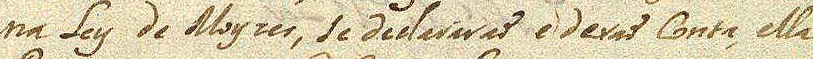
na Ley de Moyzes, se declaráraõ e deraõ Conta, ella
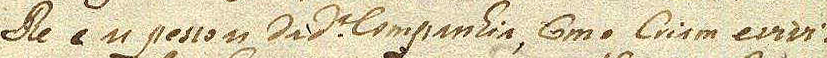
Re e as pessoas da d.a Companhia, Como Criam e vivi
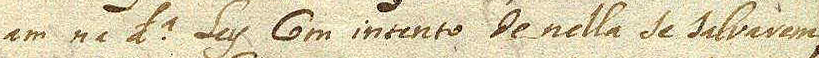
am na d̄.a Ley Com intento de nella se salvarem,
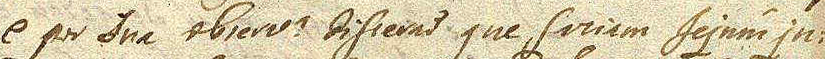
e por sua observa. disseraõ que faziam Jejuns̄ ju
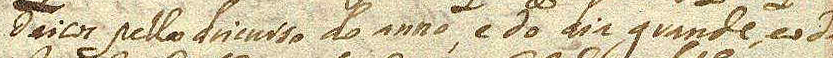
daicos pello discurso do anno, e do dia grande, e o da
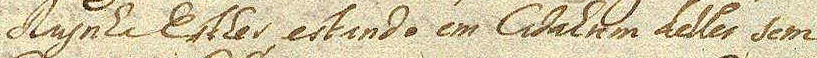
Raynha Esther, estando em Cada hum delles sem
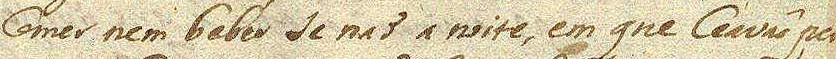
Comer nem beber senaõ a noite, em que Ceavaõ pei
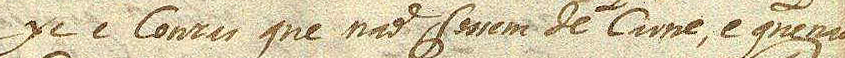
xe e Couzas que naõ fossem de Carne, e que não
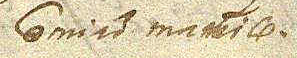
Comiaõ marisco.
